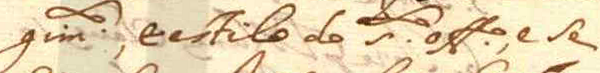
gim.to e estilo do s.to off.o, e se
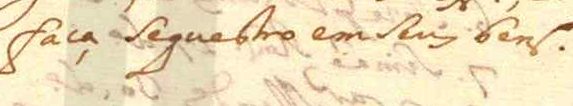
faça sequestro em seus bens.
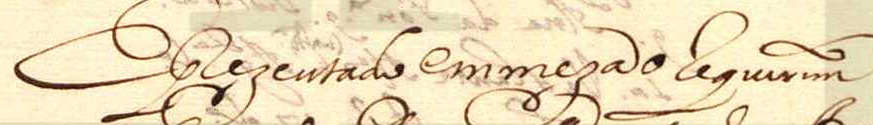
E pRezentado em meza o Requerim.to
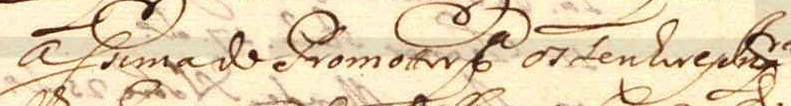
assima do Promotor pa os senhores Inqres
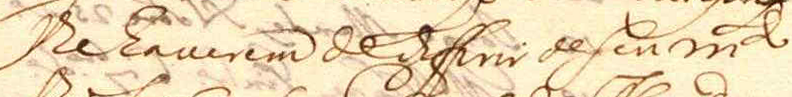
lhe hauerem do differir de seu mdo
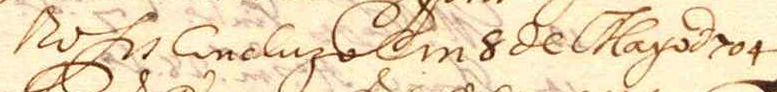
lho fis Concluzo Em 8 de Mayo d̄ 704
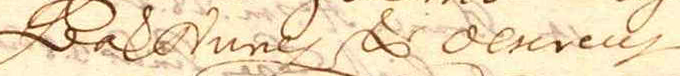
Joaõ Nunes Xer o escreuj
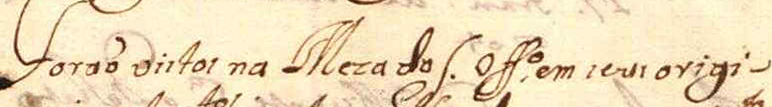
Foraõ vistos na Meza do S. Off.o em seus origi
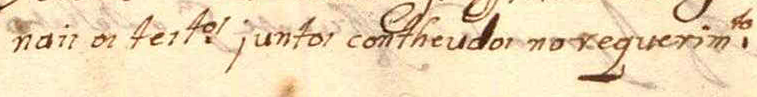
nais os test.os juntos contheudos no requerim.to
